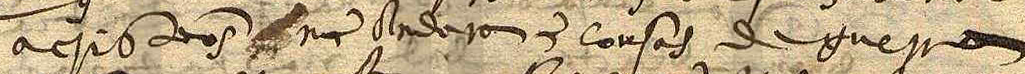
a cristaõs nē Andara ē cousas de guerra
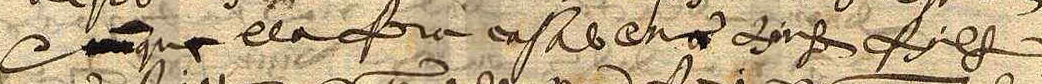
e que lla fora casado e nā tjnha fylho
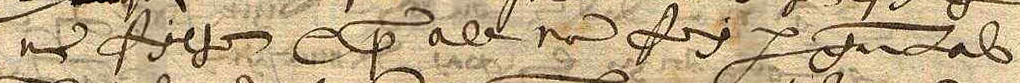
ne̅ fylha e p̄o all nā foj ꝑgūtado
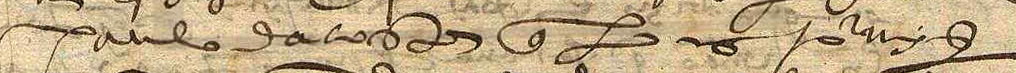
paulo da costa q̄ ho esp̄uy.
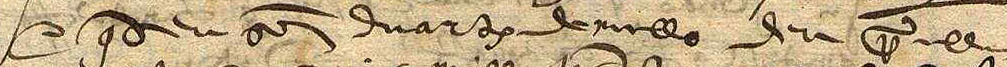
e q̄ seu s̄or duarte de mello deu p̄o elle
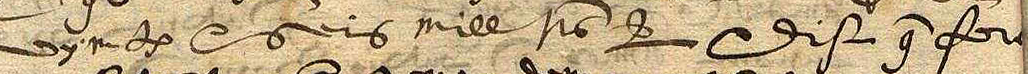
vymte e seis mill rrs̄. e dise q̄ for
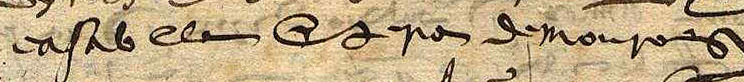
casado lla ē terra de mouros.
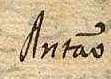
Antão
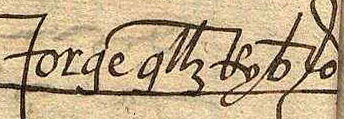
Jorge ḡllz Rybro
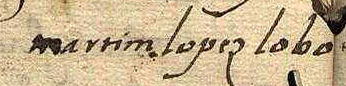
martim lopez lobo
